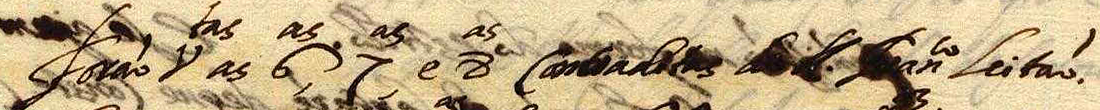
Foraõ Vtas as 6as, 7as, e 8as Contradictas do R. Franco Leitaõ.
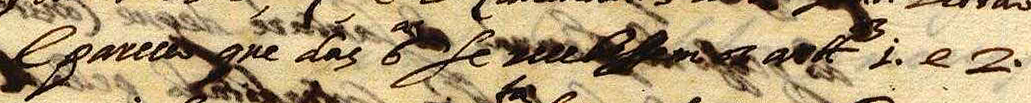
E pareceo que das 6as se recebessem os arttos i. e 2.
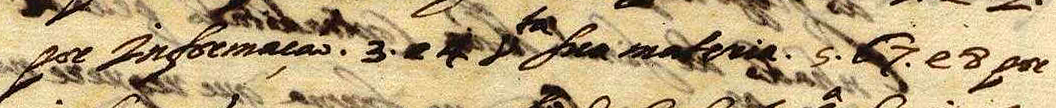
por Informaçaõ. 3. e 4 Vta sua materia. 5. 6. 7. e 8 por
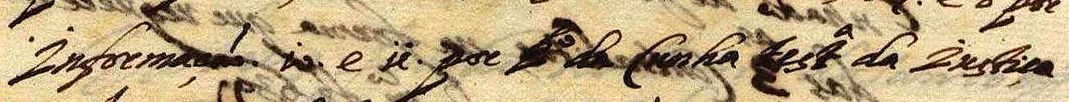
Informaçaõ. io. e ii. por Po da Cunha testa da Iustiça
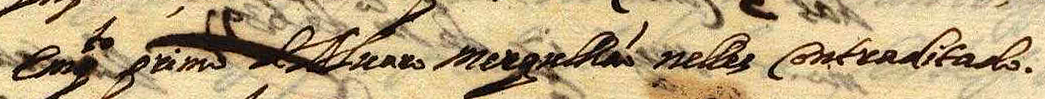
emqto primo de Aluaro mergulhaõ nelles Contraditado.
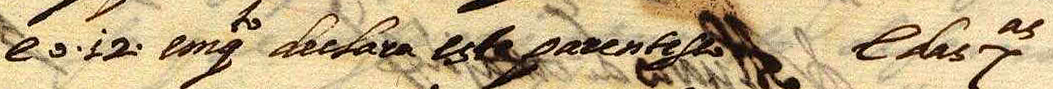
e o .i2. emqto declara este parentesco E das 7as
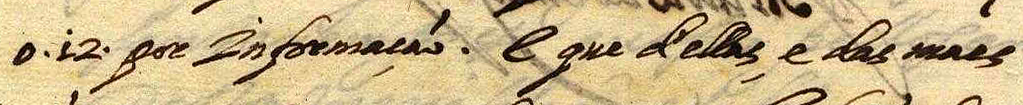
o .i2. por Informação. E que d'ellas, e das maes
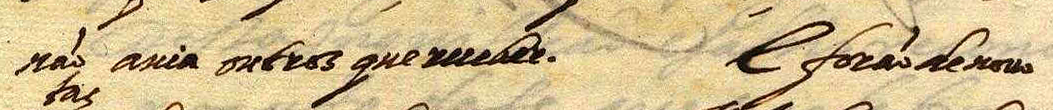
naõ auia outros que receber. E foraõ de nouo
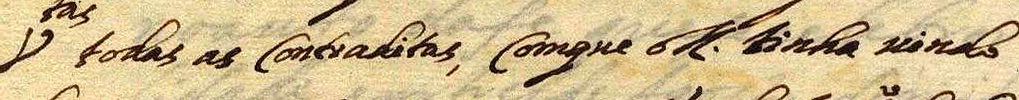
Vtas todas as Contraditas, Com que o R. tinha uindo
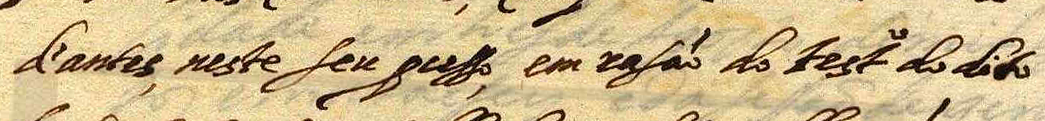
d'antes, neste seu ꝓcesso, em rasaõ do testo do dito
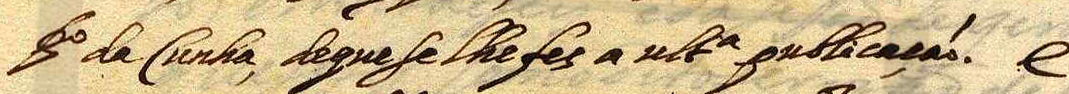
Po da Cunha, de que se lhe fes a ulta publicaçaõ. E
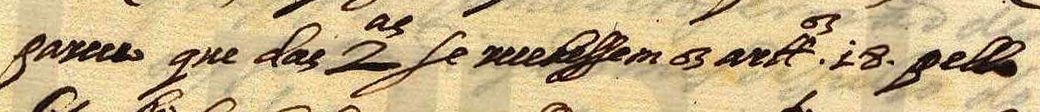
pareceo que das 2as se recebessem os arttos. i8. pello
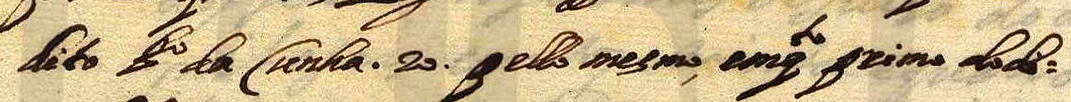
dito Po da Cunha. 20. pello mesmo, emqto primo do di
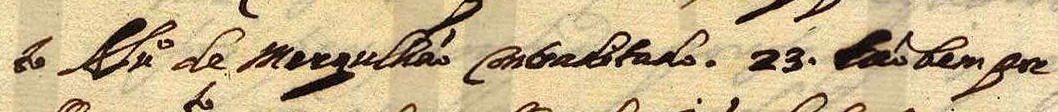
to Aluo de mergulhaõ Contraditado. 23. taõbem por
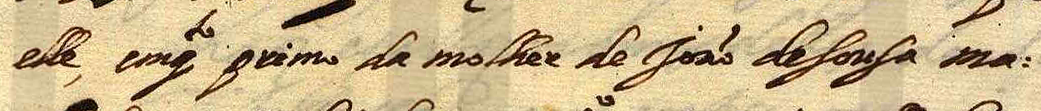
elle, emqto primo da molher de Joaõ de sousa ma
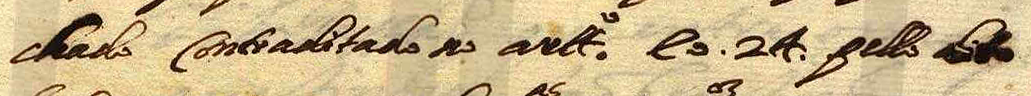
chado Contraditado no artt.o e o. 24. pello dito
